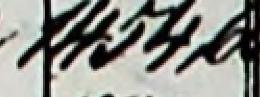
1454,6
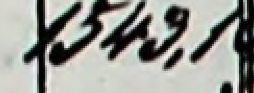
1543,1
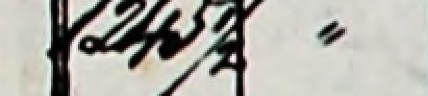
1245 1/2 „
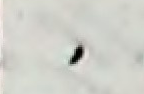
,
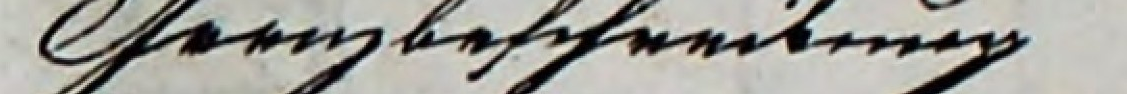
Grenzbeschreibung
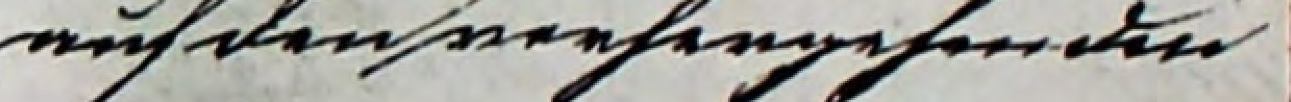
auf den vorhergehen den
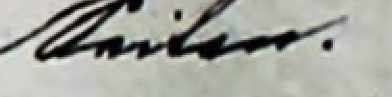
Seiten.
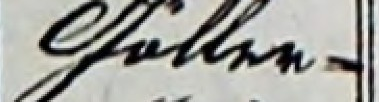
Göller=
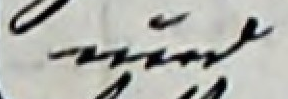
und
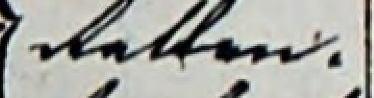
Detten„
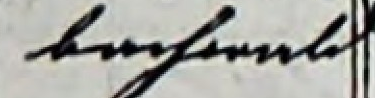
bachwald
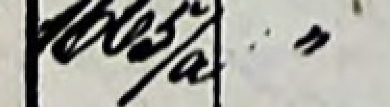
1665/a „
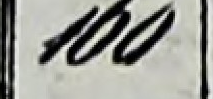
160
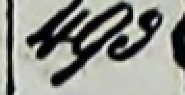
493
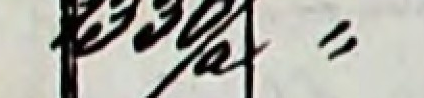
1336/a „
